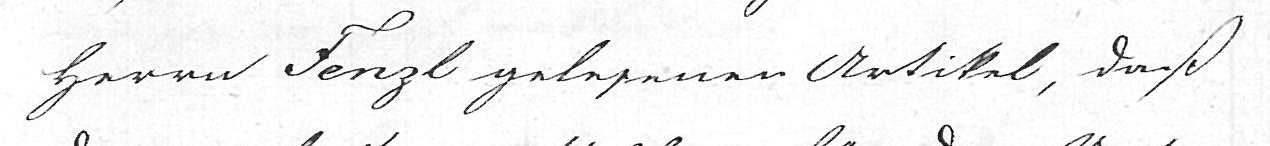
Herrn Fenzl gelesenen Artikel, daß
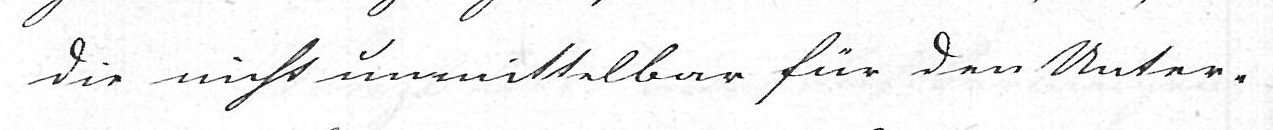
die nicht unmittelbar für den Unter-
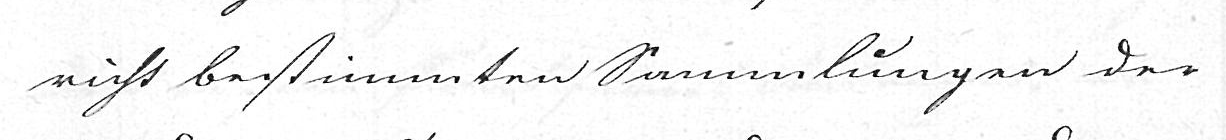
richt bestimmten Sammlungen der
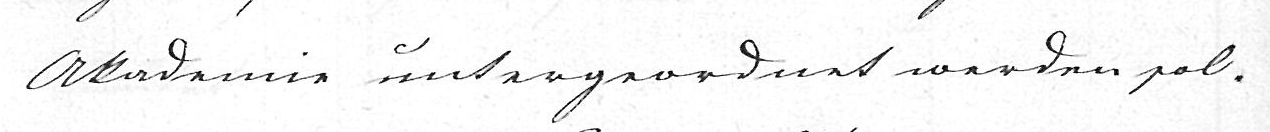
Akademie untergeordnet werden sol-
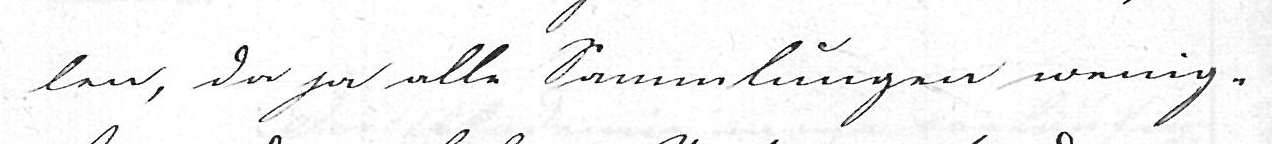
len, da ja alle Samlungen wenig-
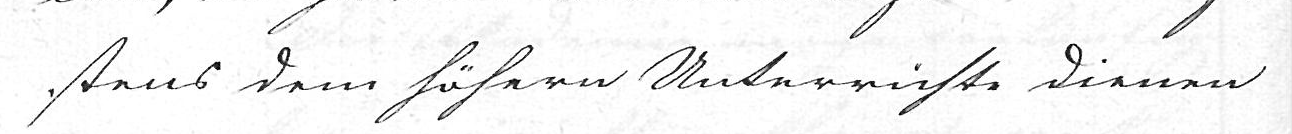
stens dem höhern Unterrichte dienen
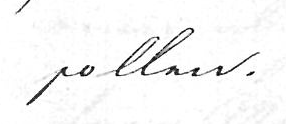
sollen.
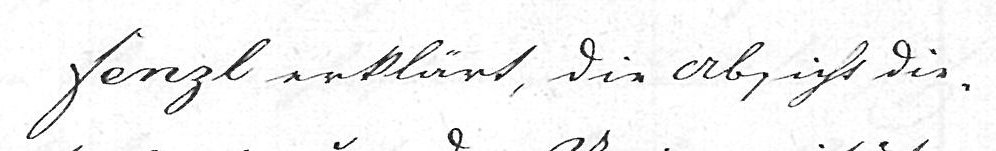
Fenzl erklärt, die Absicht die-
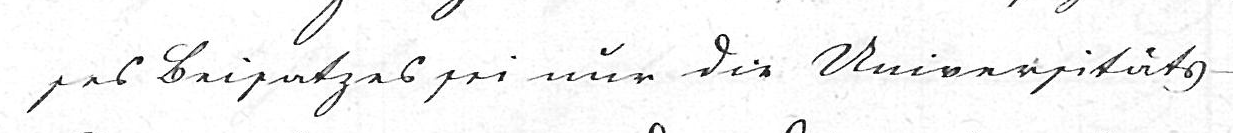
ses Beisatzes sei nur die Universitäts-
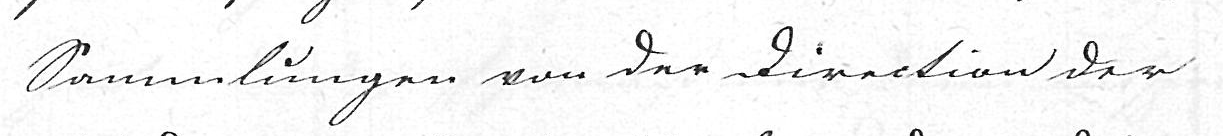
Sammlungen von der Direction der
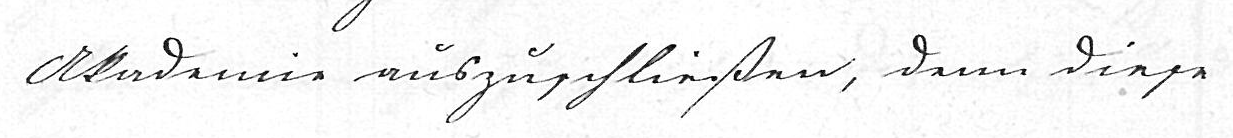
Akademie auszuschließen, denn diese
